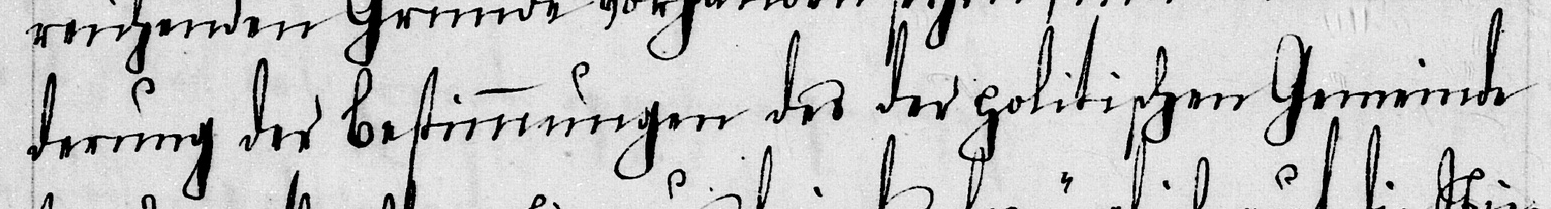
derung der Bestimmungen des der politischen Gemeinde
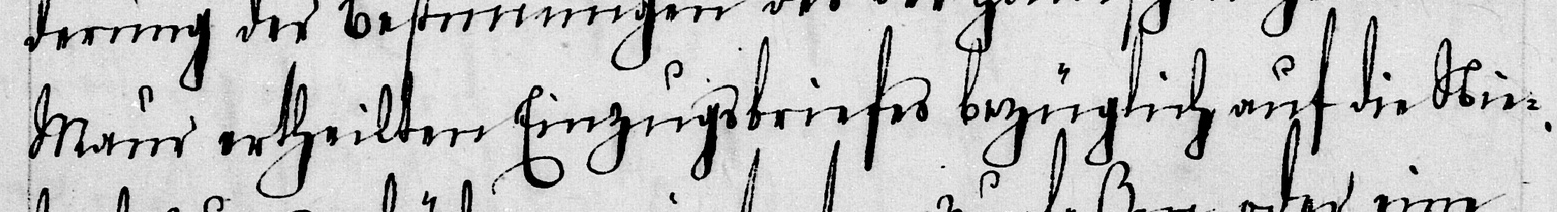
Maur ertheilten Einzugsbriefes bezüglich auf die Nie¬
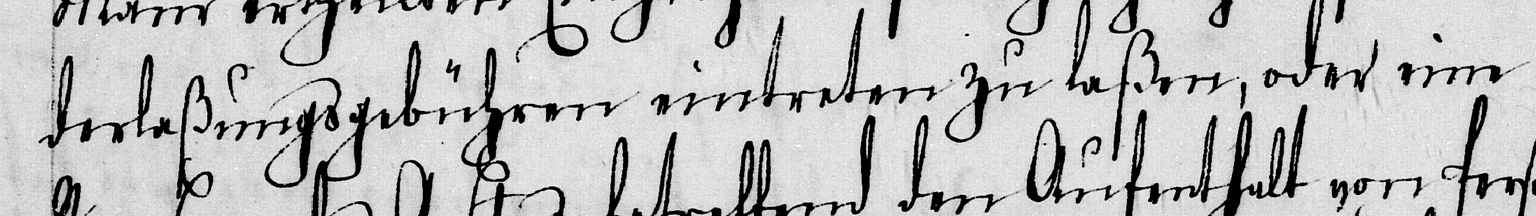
derlaßungsgebühren eintreten zu laßen, oder eine
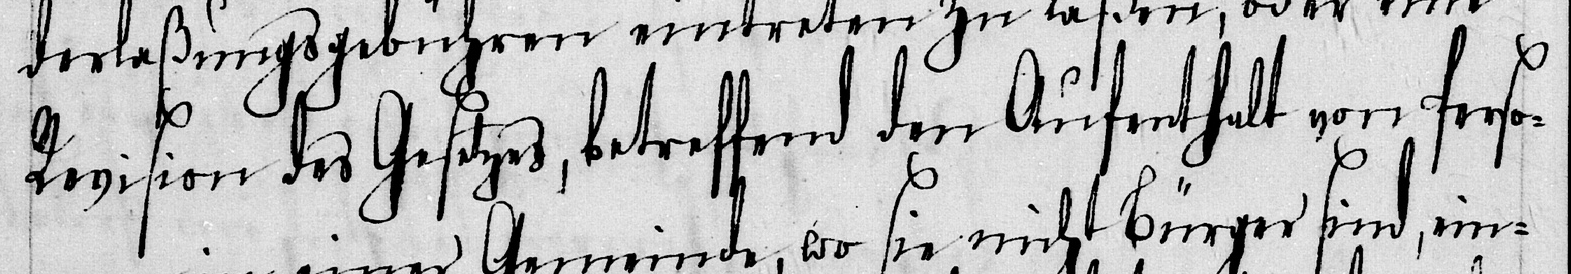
des Gesetzes, betreffend den Aufenthalt von Pers¬
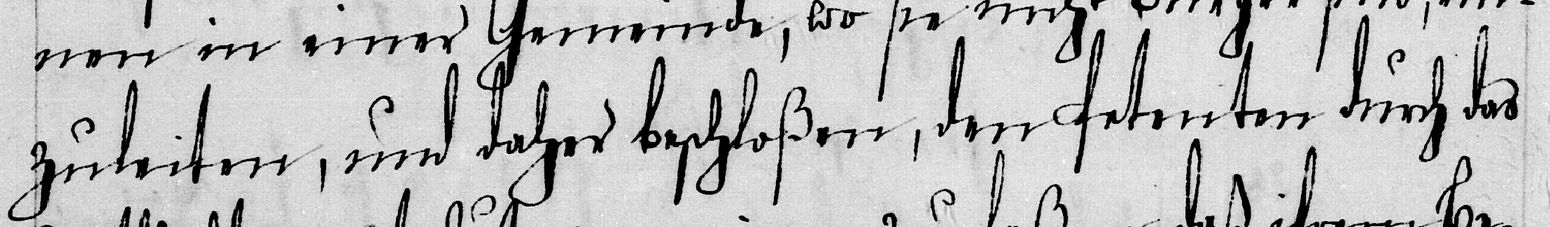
zuleiten, und daher beschloßen, den Petenten durch das
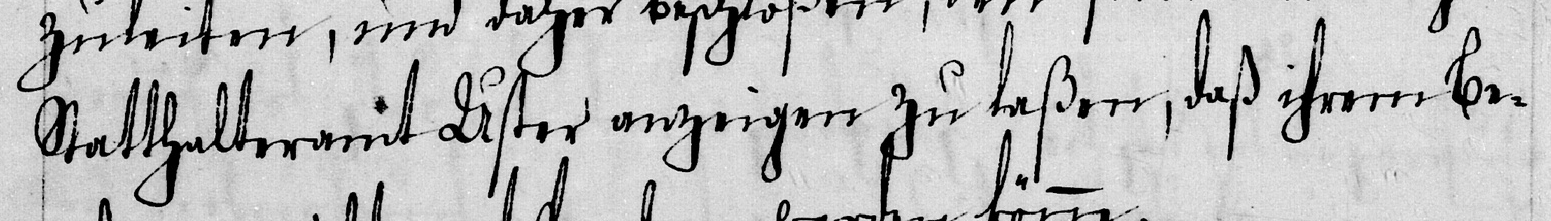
Statthalteramt Uster anzeigen zu laßen, daß ihrem Be¬
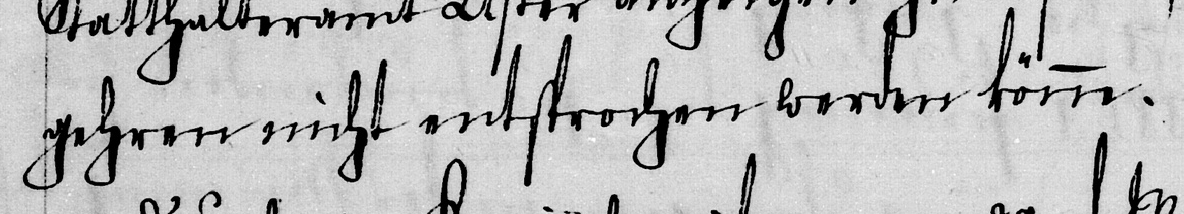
gehren nicht entsprochen werden könne.
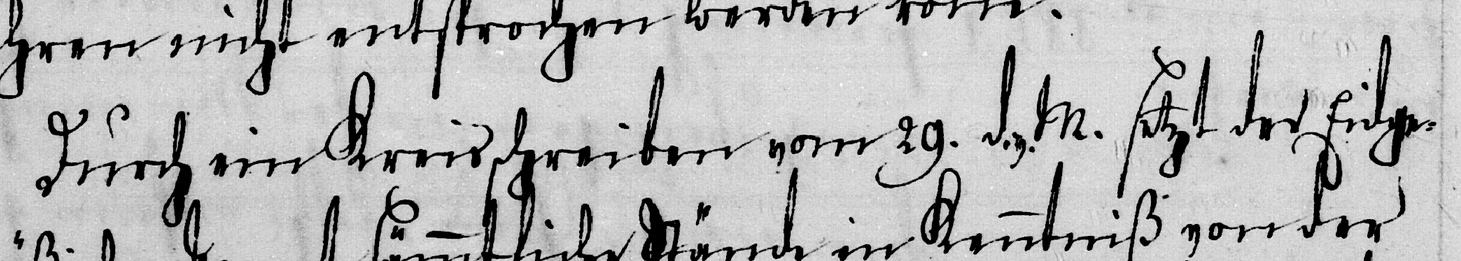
Durch ein Kreisschreiben vom 29. d. v. M. setzt der Eidge¬
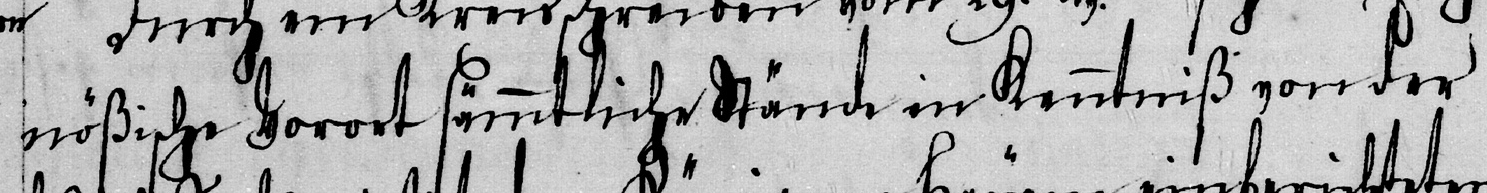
nößische Vorort sämmtliche Stände in Kenntniß von der
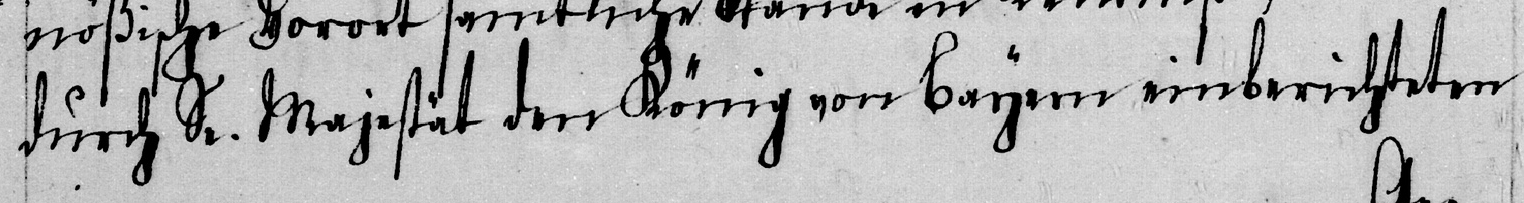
durch Se. Majestät den König von Bayern einberichteten
